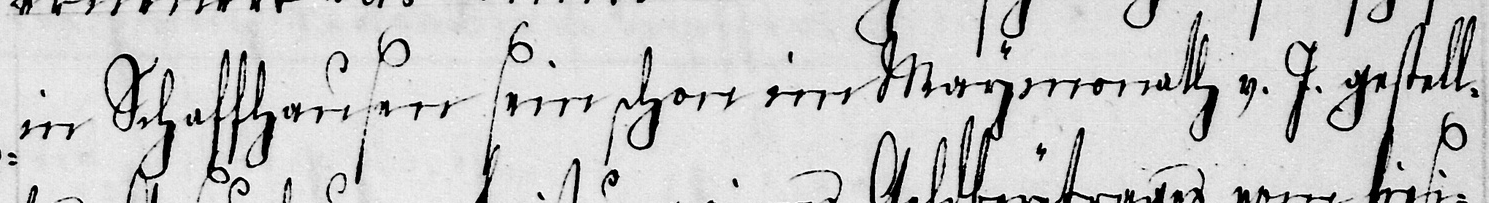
in Schaffhausen sein schon im Maymonath v. J. gestel¬
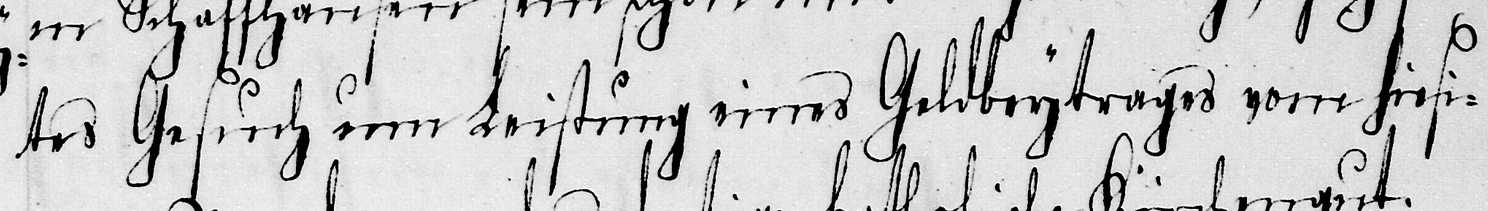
ltes Gesuch um Leistung eines Geldbeytrages vom hiesi¬
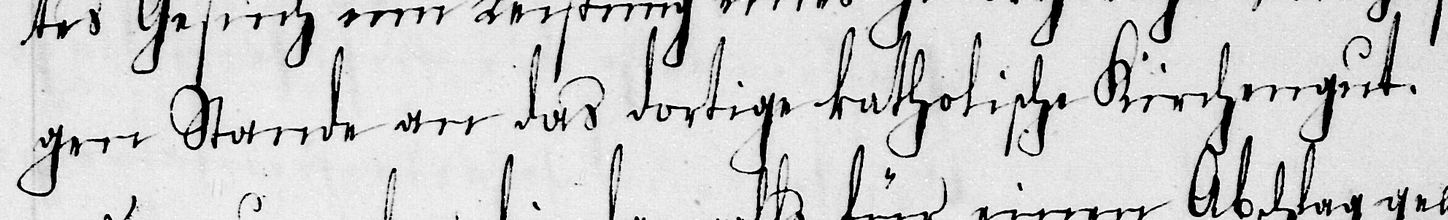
gen Stande an das dortige katholische Kirchengut.
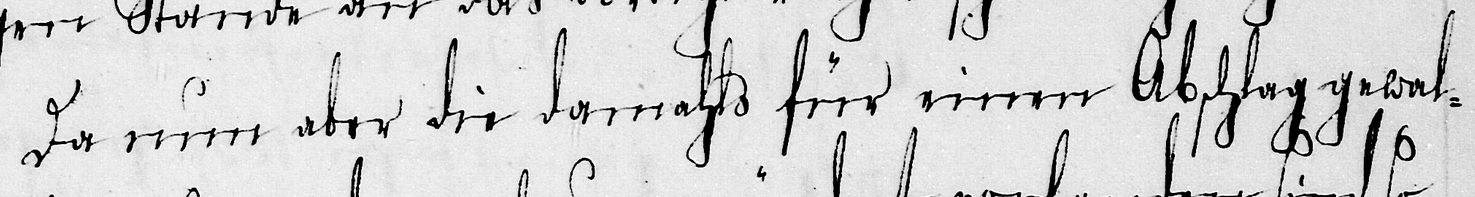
Da nun aber die damahls für einen Abschlag gewal¬
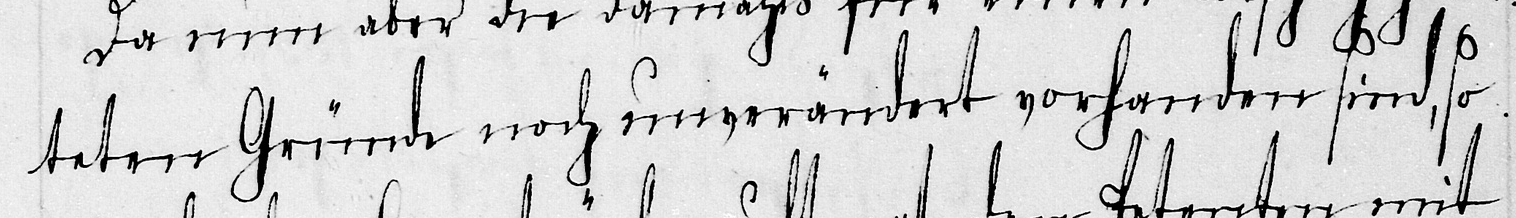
teten Gründe noch unverändert vorhanden sind, so
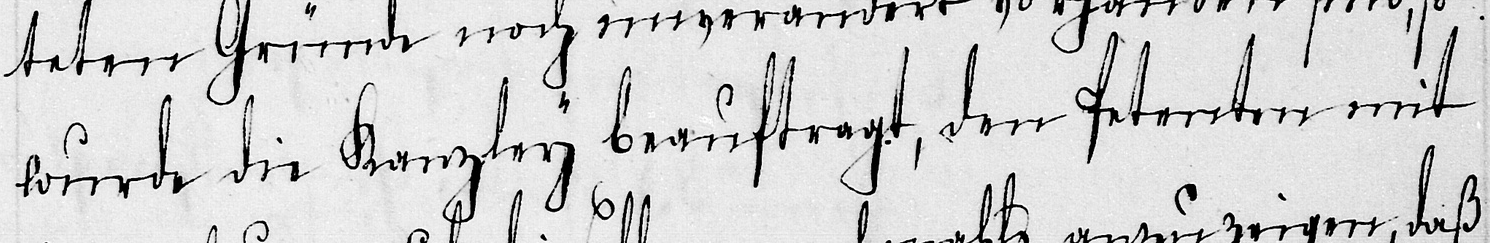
wurde die Kanzley beauftragt, den Petenten mit
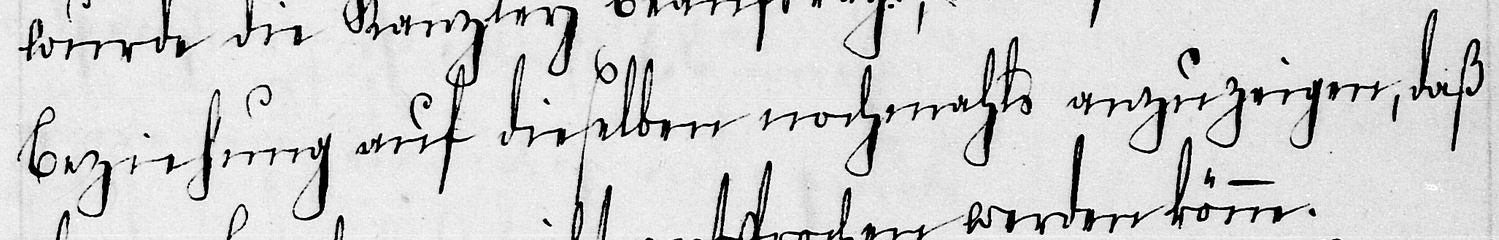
Beziehung auf dieselben nochmahls anzuzeigen, daß
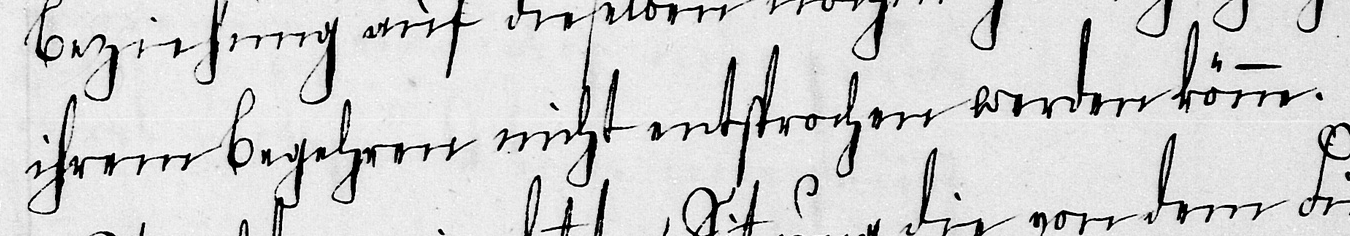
ihrem Begehren nicht entsprochen werden könne.
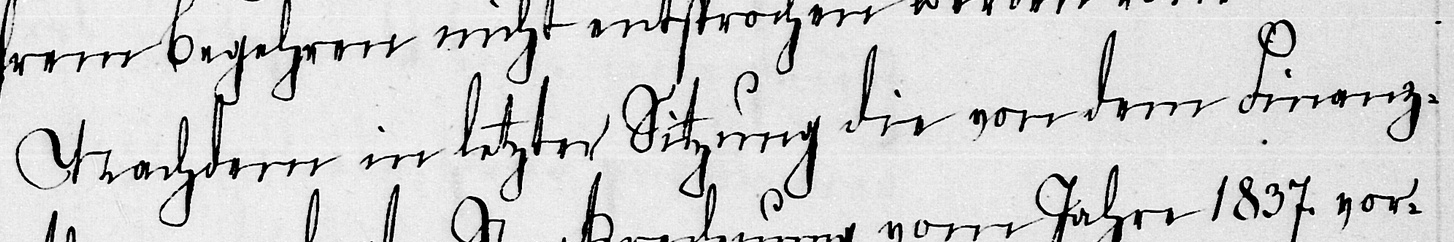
Nachdem in letzter Sitzung die von dem Finanz¬
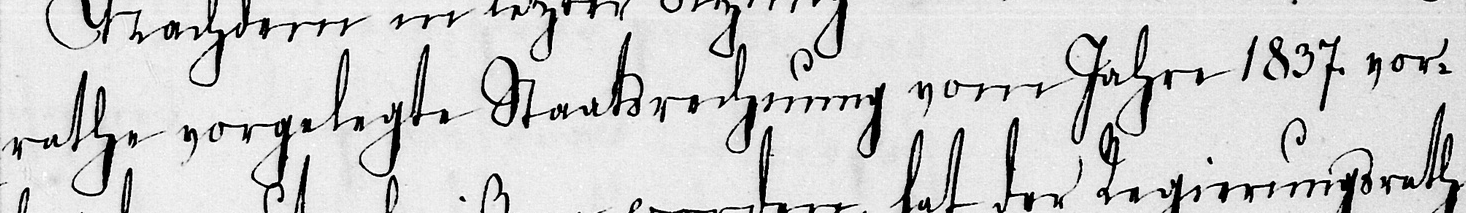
rathe vorgelegte Staatsrechnung vom Jahre 1837. vor¬
